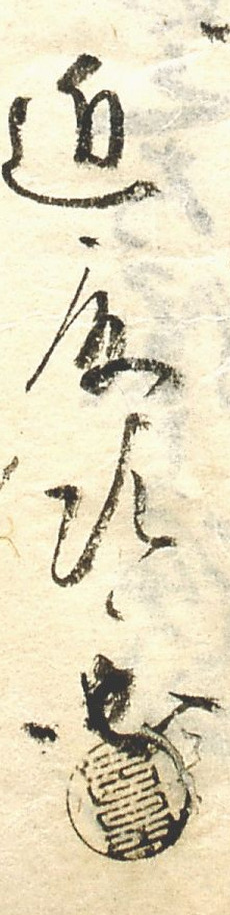近藤次兵衛
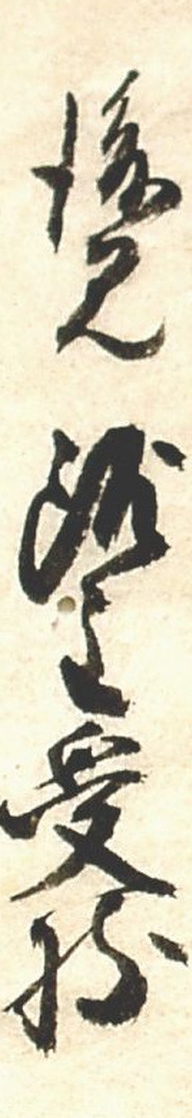後見銀主受持
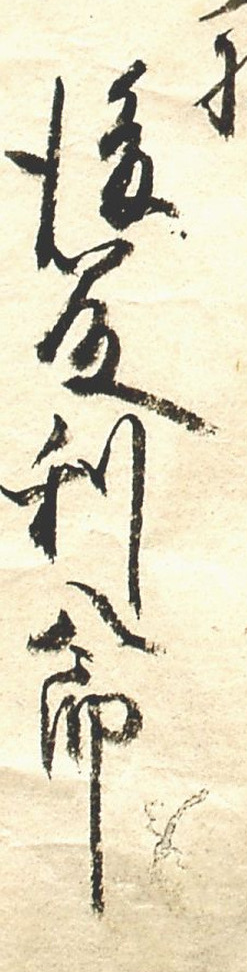後藤利八郎
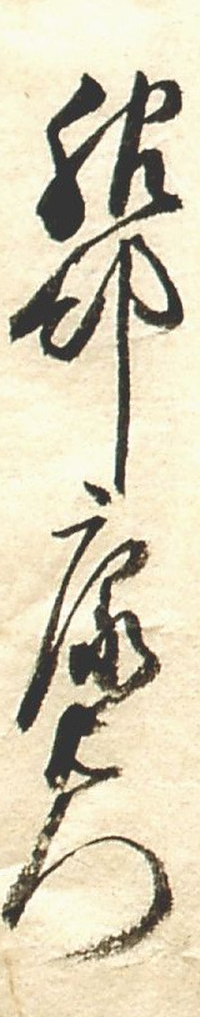服部藤右衛門
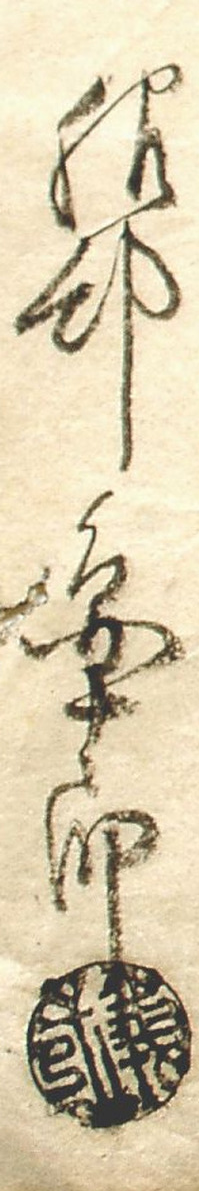服部円十郎

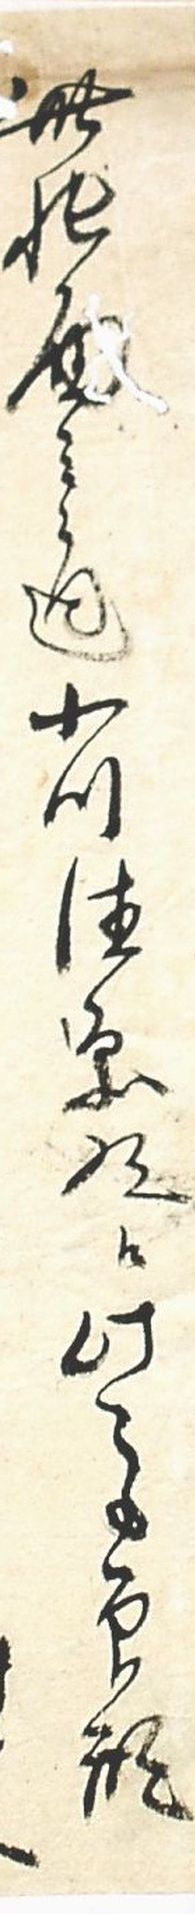此帳面之通小川徳兵衛殿え此事印形
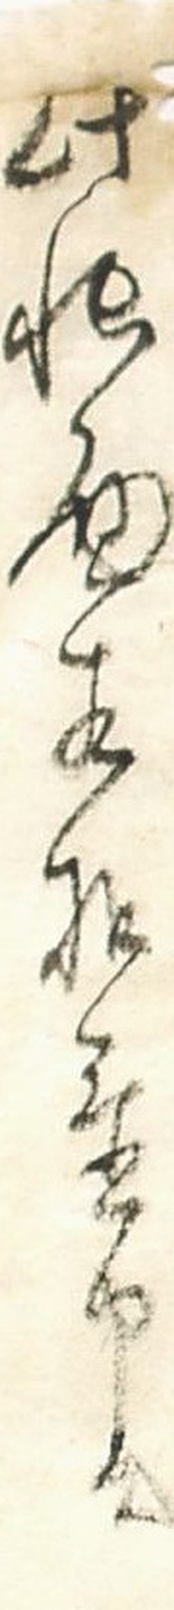此帳面相控置申上候
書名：御国産漆製法越法算建書共取替速判帳
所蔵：鳴門教育大学 Naruto University of Education
